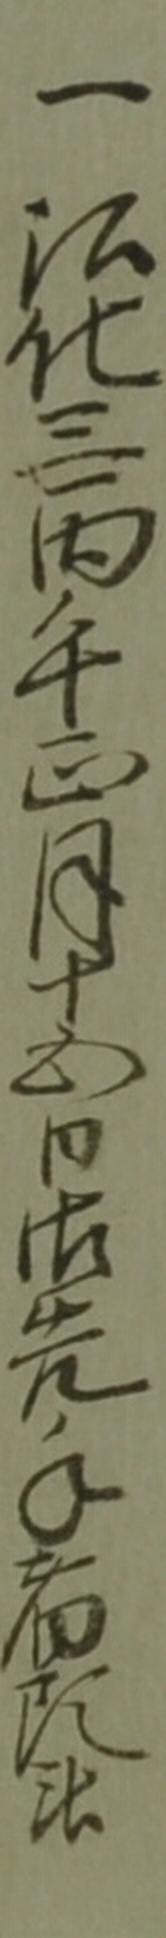一弘化三丙午正月十五日御先手者頭被
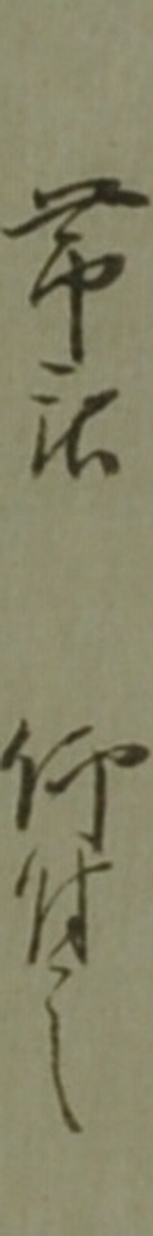帯被仰付之
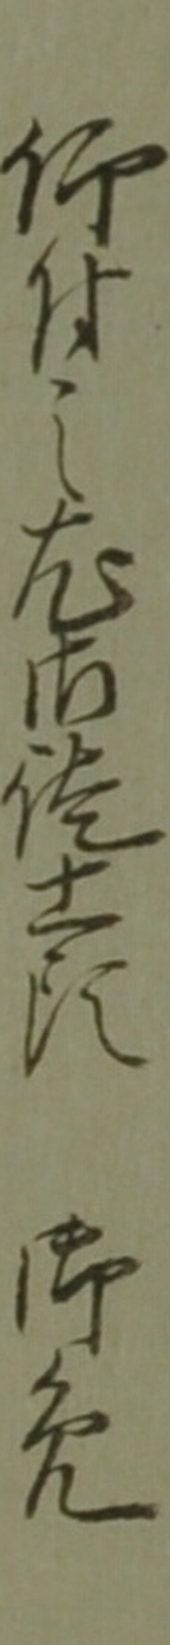仰付之尤御徒士頭御免

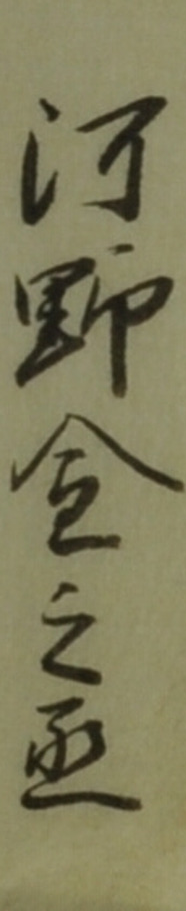河野金之丞
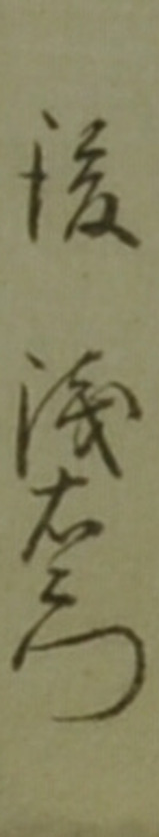後儀右衛門
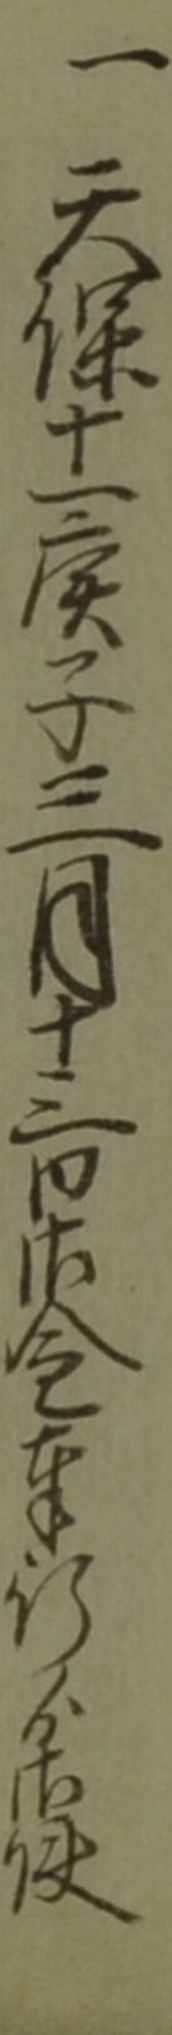一天保十一庚子三月十三日御金奉行ゟ御使
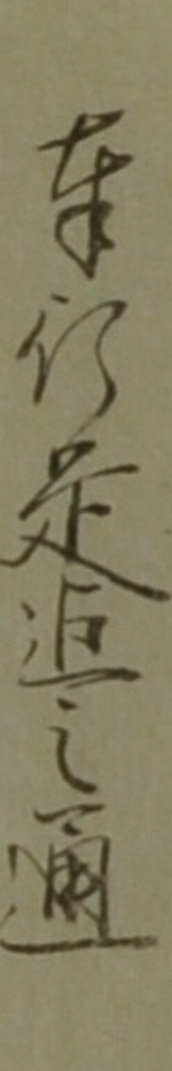奉行是迄之通
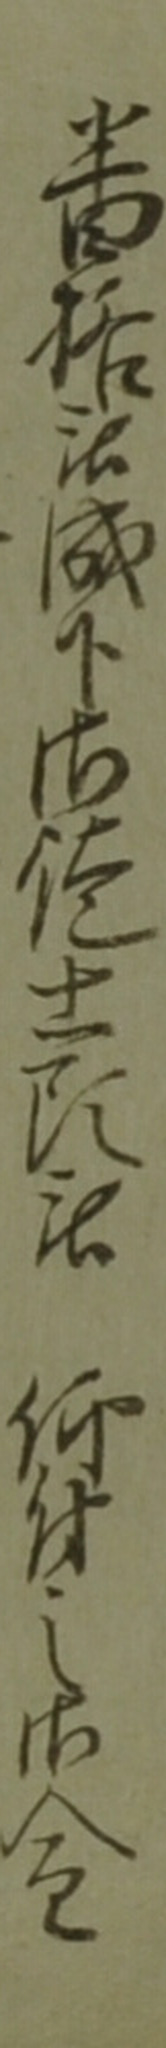番格被成下御徒士頭被仰付之御金
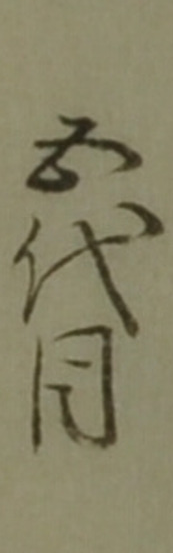五代目
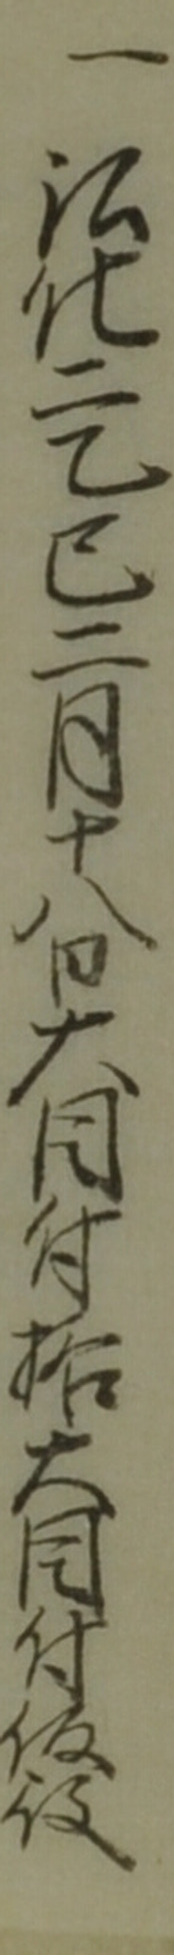一弘化二乙巳二月十八日大目付格大目付仮役
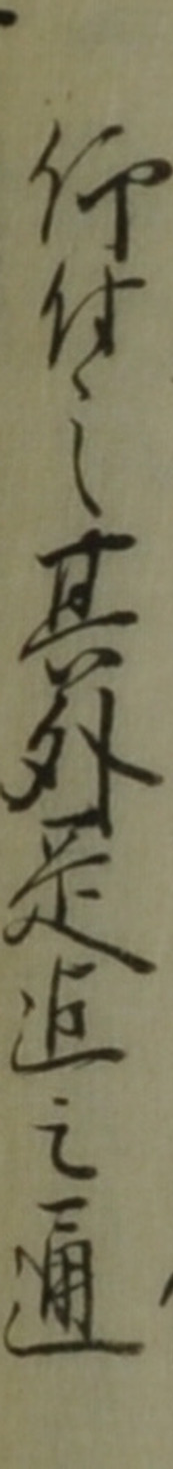仰付之其外是迄之通
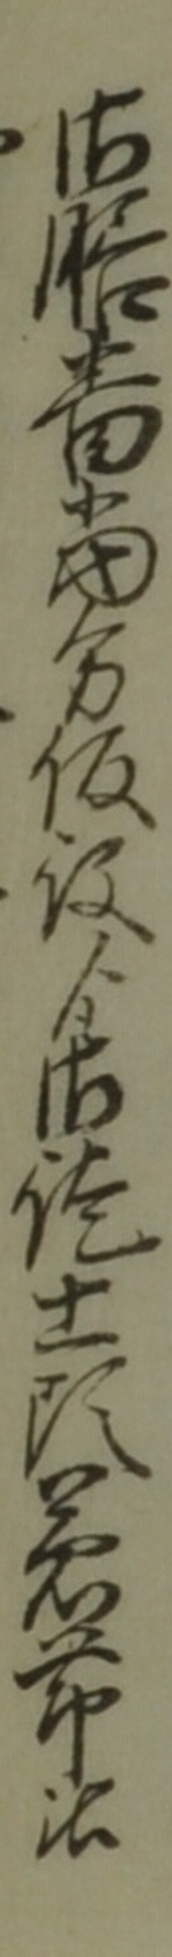御膳番当分仮役ゟ御徒士頭兼帯被
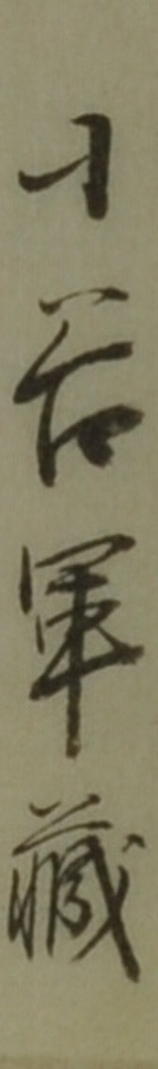小谷軍蔵
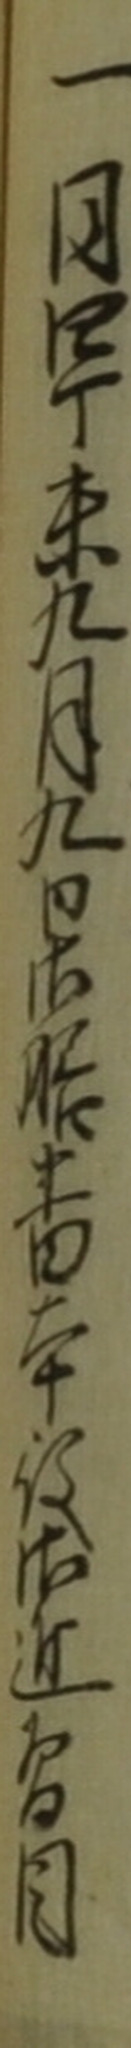一同四丁未九月九日御膳番本役御近習同
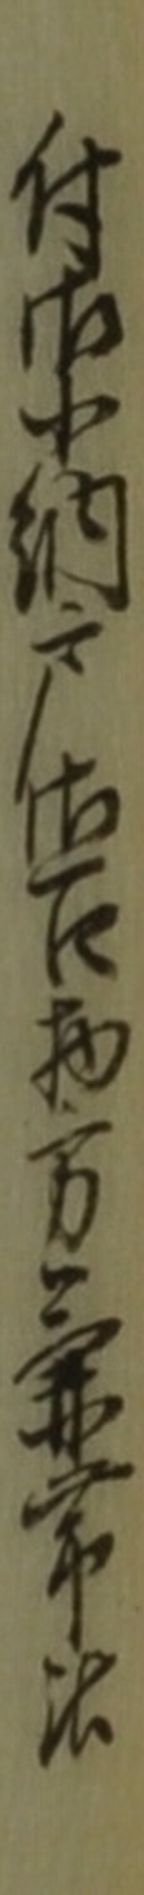付御小納戸御召物方兼帯被
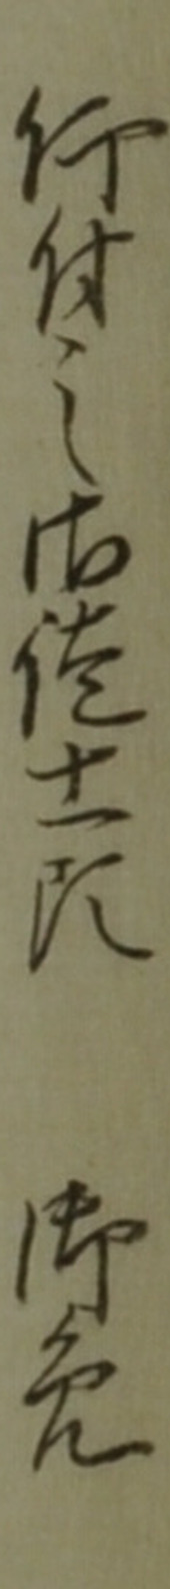仰付之御徒士頭御免
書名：諸御役代々録（六）
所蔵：伊那市立高遠町図書館・合同会社AMANE
